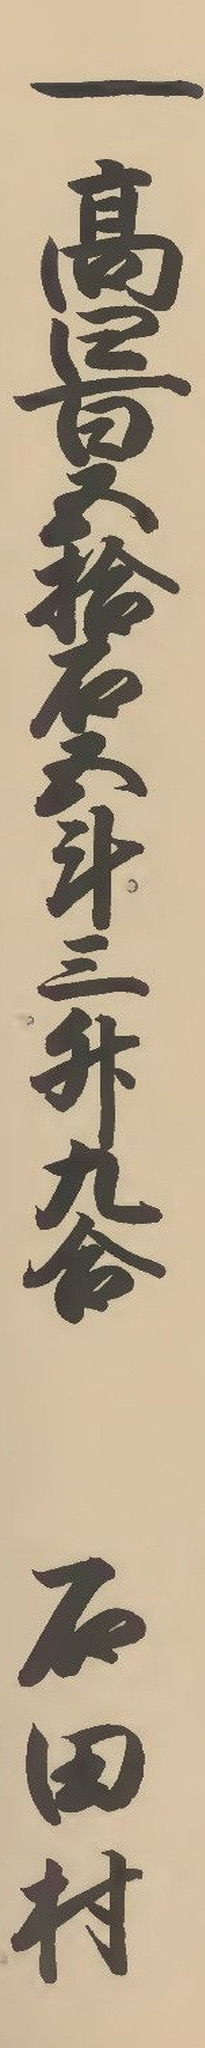一高四百五拾石五斗三升九合石田村
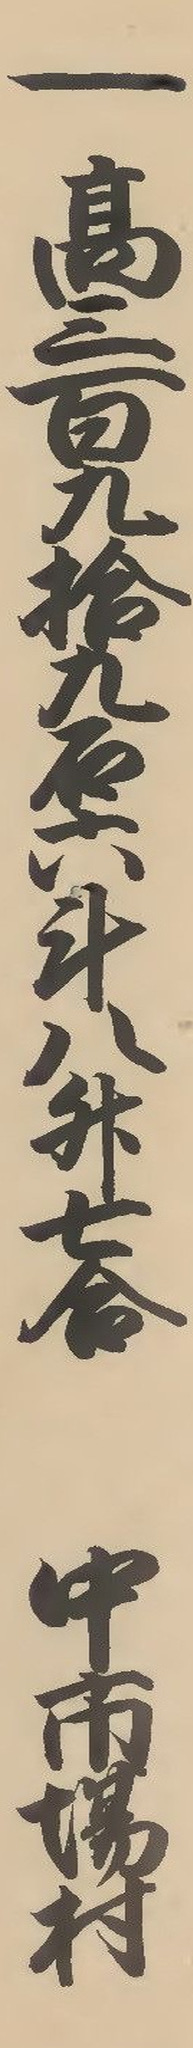一高三百九拾九石六斗八升七合中市場村
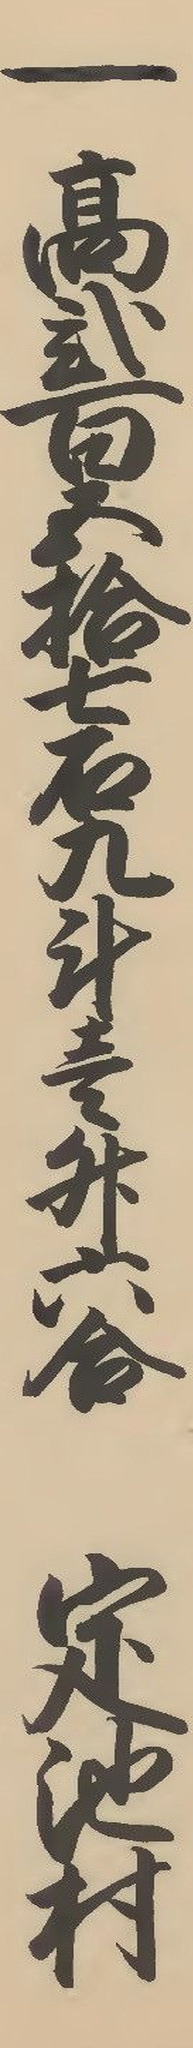一高弐百五拾七石九斗壱升六合定池村
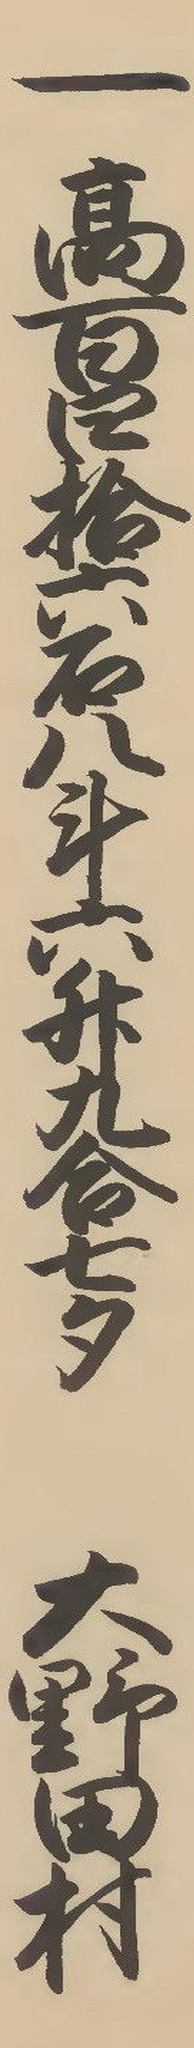一高百四拾六石八斗六升九合七勺大野田村
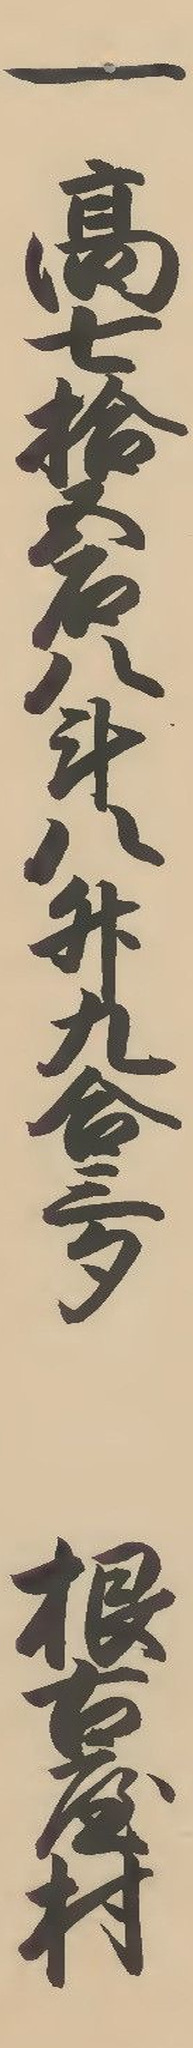一高七拾五石八斗八升九合三勺根古屋村

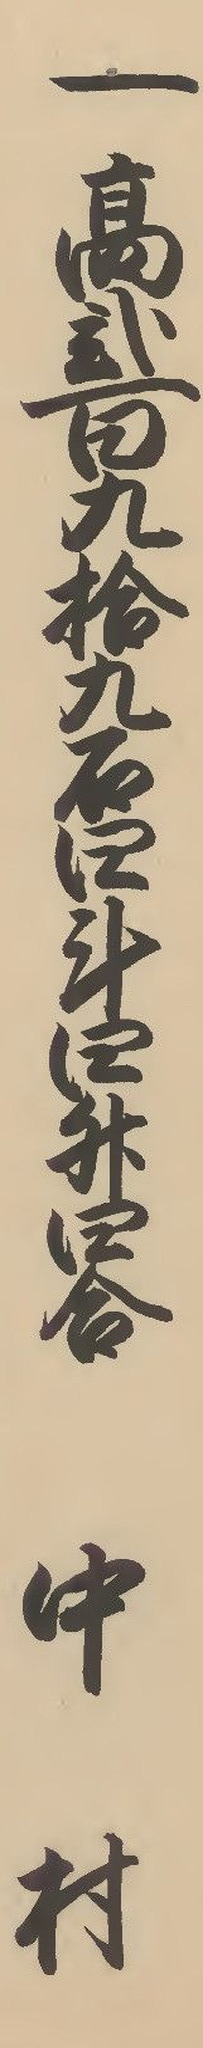一高弐百九拾九石四斗四升四合中村
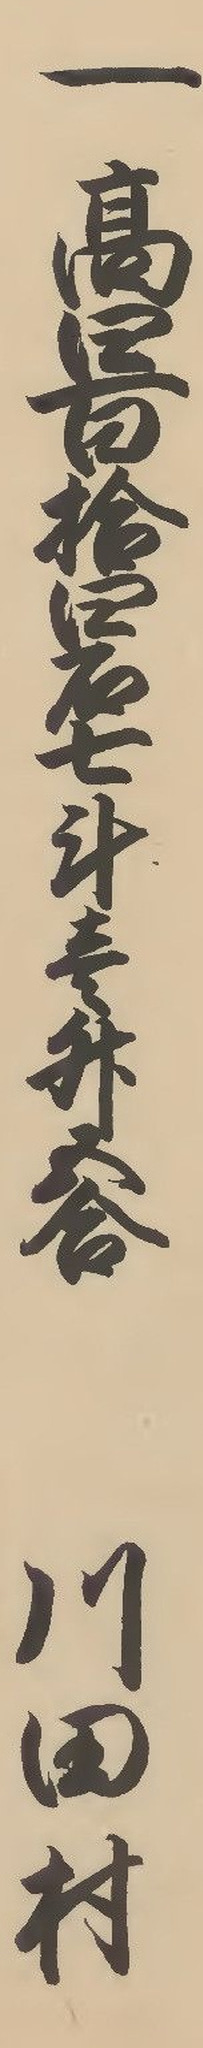一高四百拾四石七斗壱升五合川田村
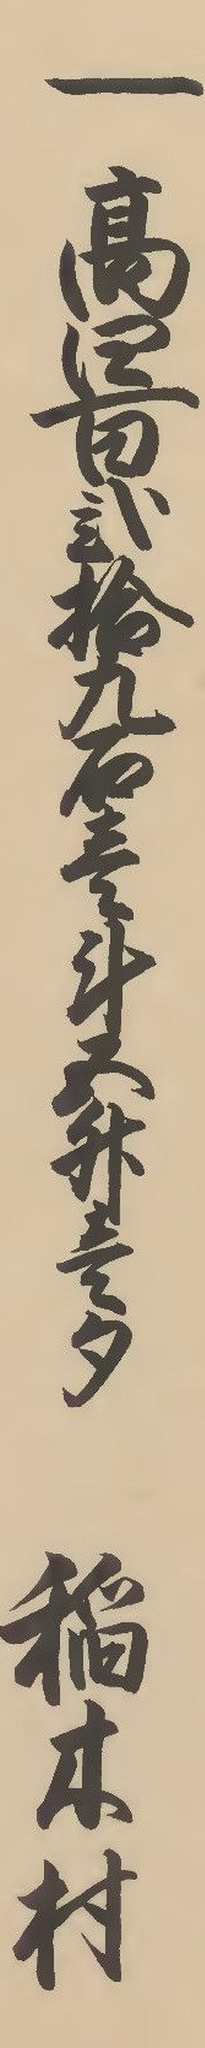一高四百弐拾九石壱斗五升壱勺稲木村
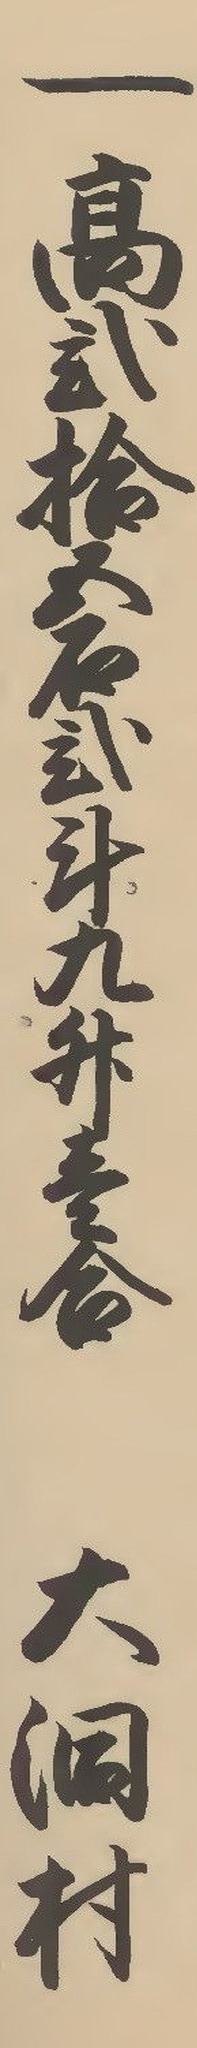一高弐拾五石弐斗九升壱合大洞村
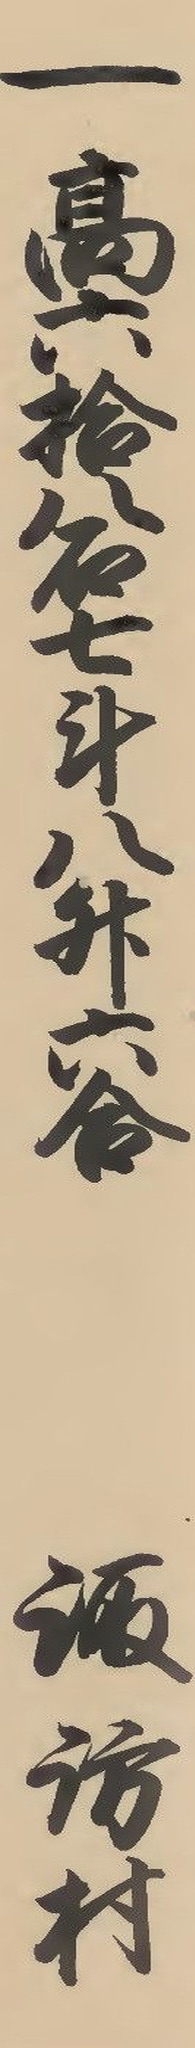一高六拾八石七斗八升六合諏訪村
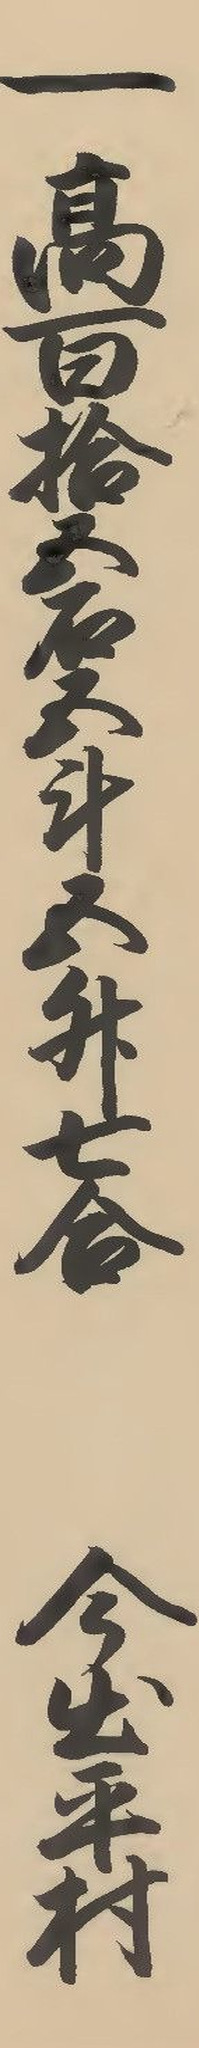一高百拾五石五斗五升七合今出平村
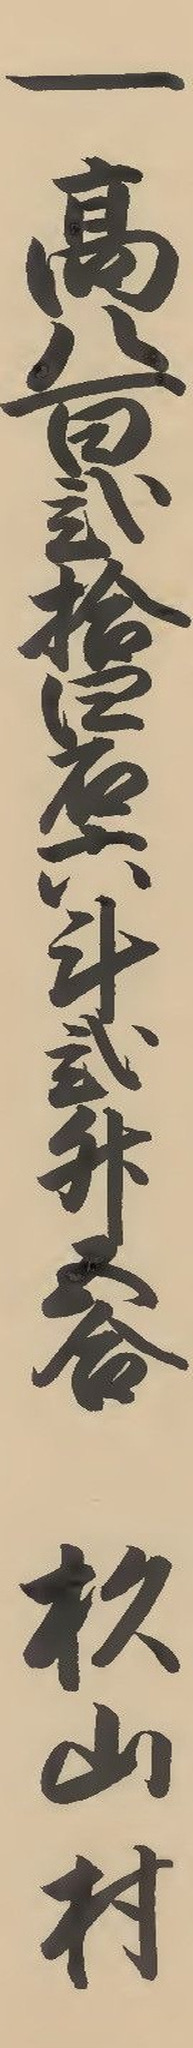一高八百弐拾四石六斗弐升五合杉山村
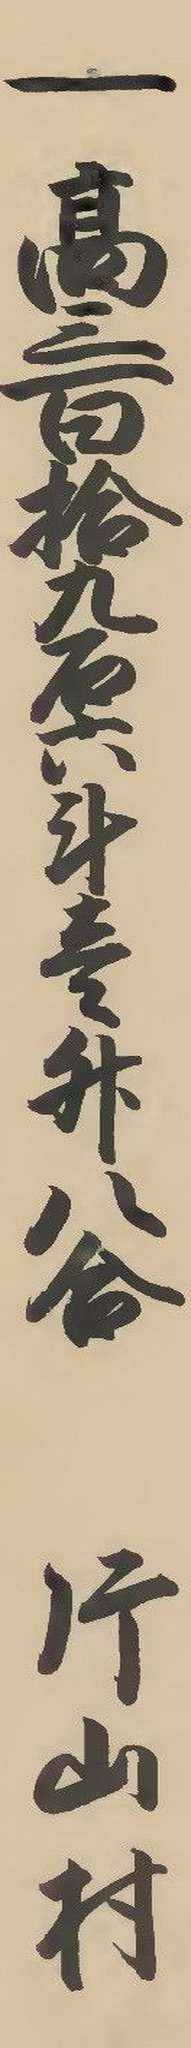一高三百拾九石六斗壱升八合片山村

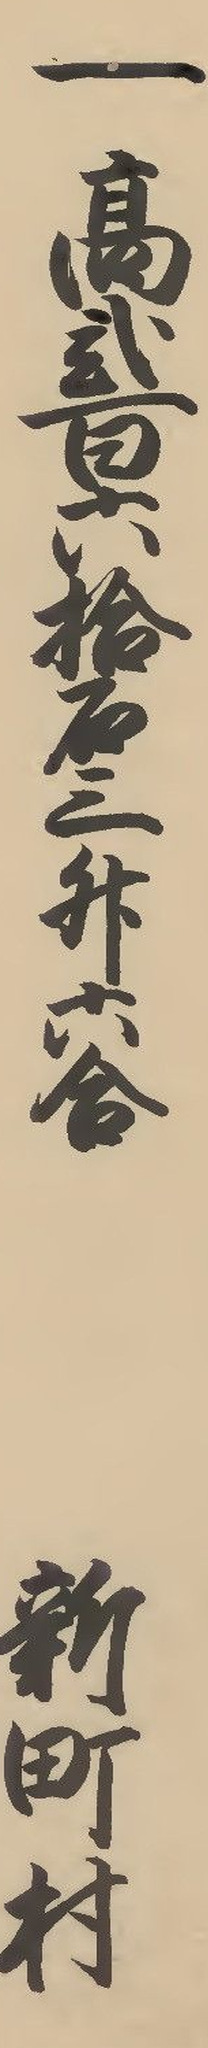一高弐百六拾石三升六合新町村
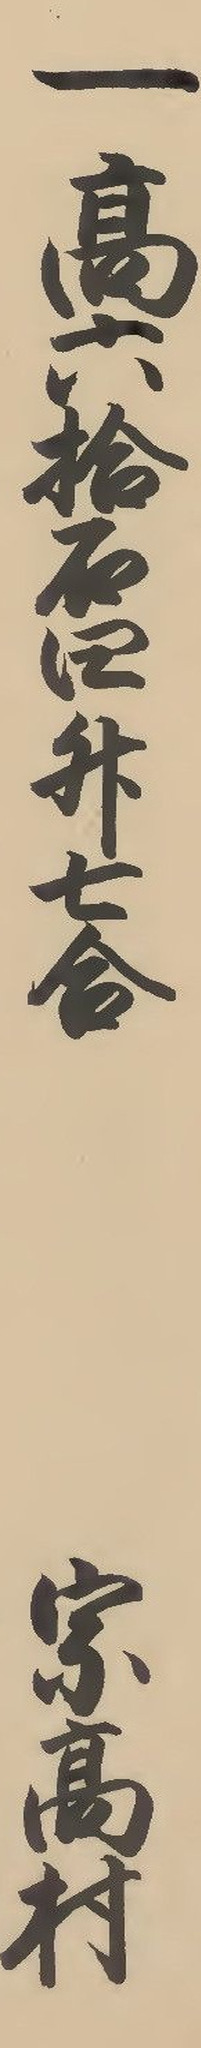一高六拾石四升七合宗高村
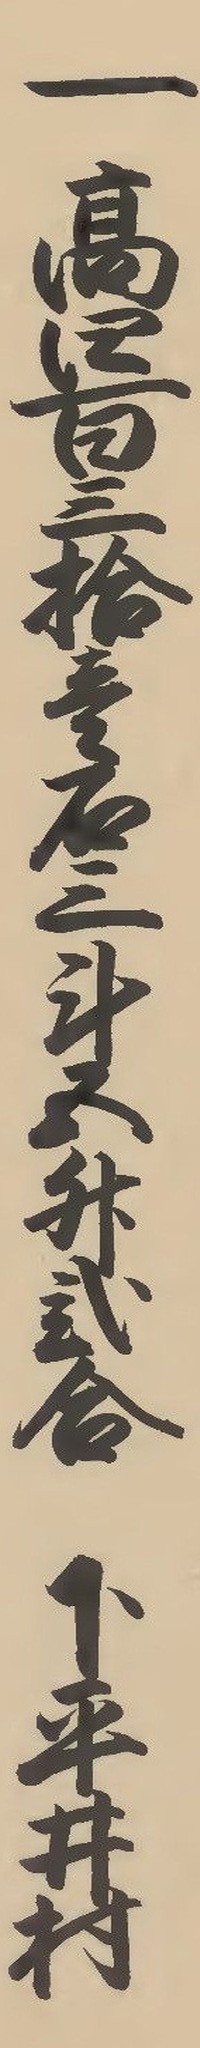一高四百三拾壱石三斗五升弐合下平井村
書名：三河国郷帳
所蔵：国立公文書館 National Archives of Japan
